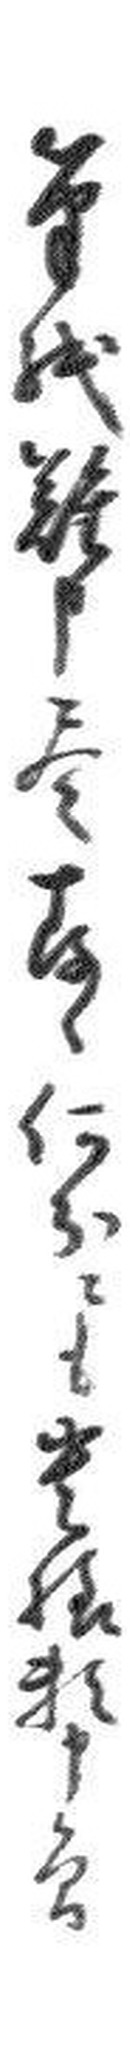筆紙難申尽存候何分ニも貴様頼申候間
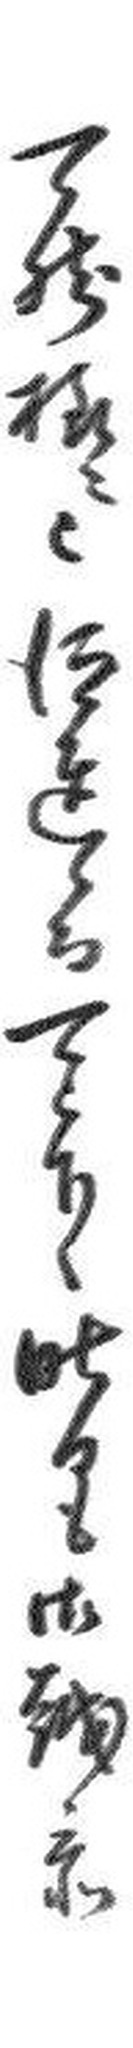可然様ニ被仰達候而可被下候昨日も御越忝

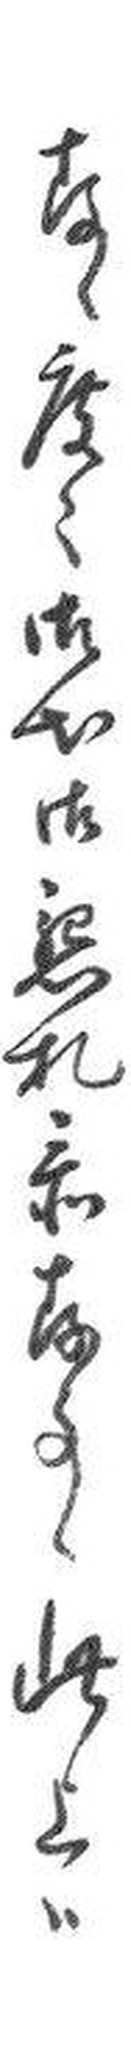存候度々御出御懇札忝存事候此上ㇵ
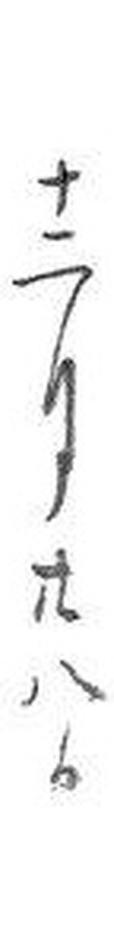十二月廿八日
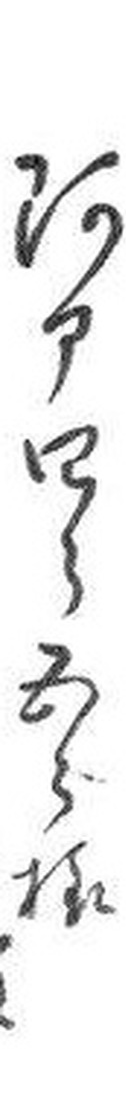阿部四郎五郎様
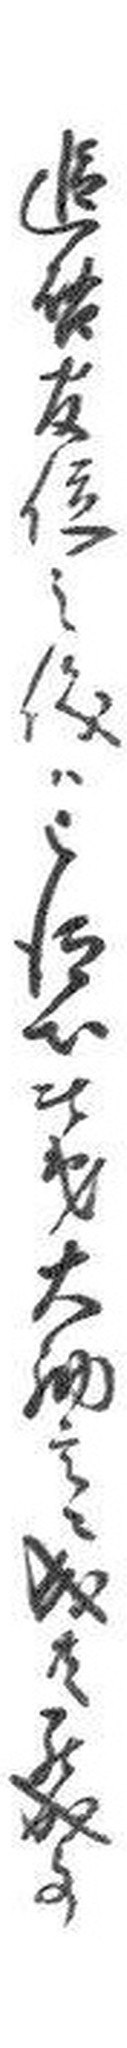追啓官位之儀ㇵ被仰出次第大納言ニ成共罷成事
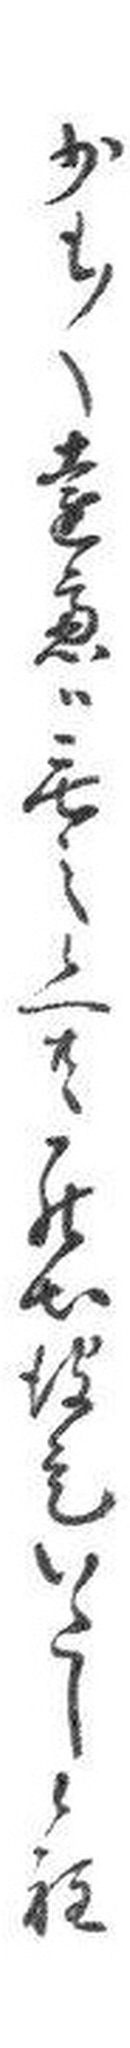少も〳〵遠慮ㇵ無之候へ共罷出彼是いたし候程
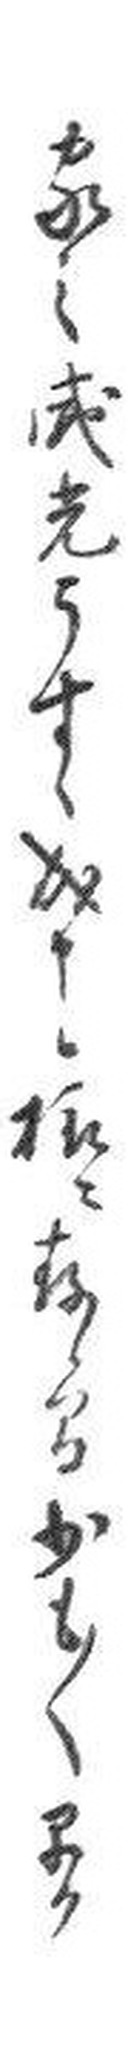家之威光うすく成申候様ニ存候間少も〳〵早ク
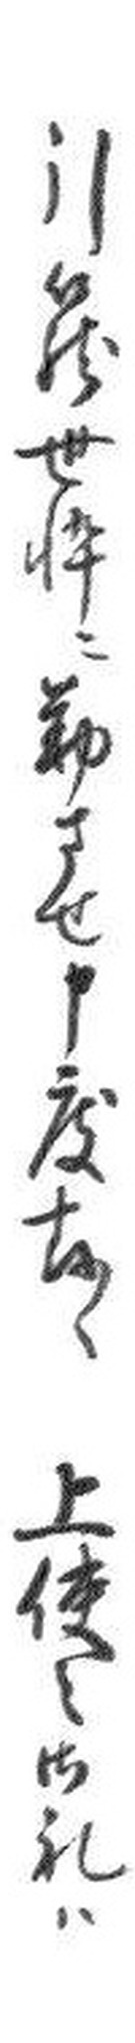引籠世忰ニ勤させ申度存候上使之御礼ㇵ
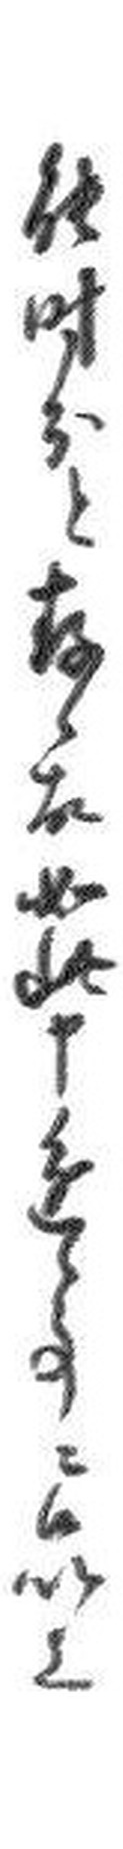能時分と存候故如此申進候事ニ候以上
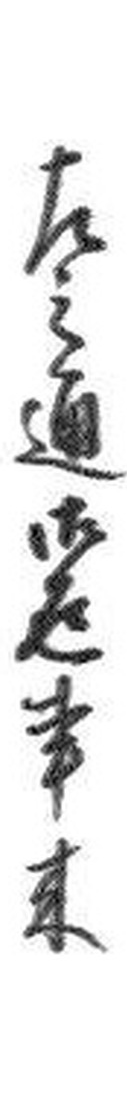左之通御返書来
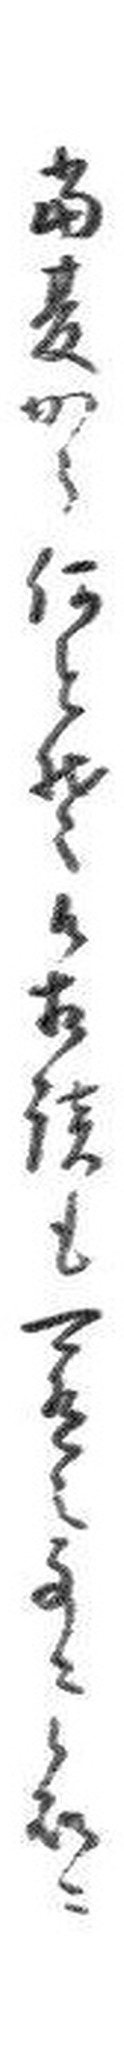当夏から何とそ御相談も可有之事ニ候処ニ
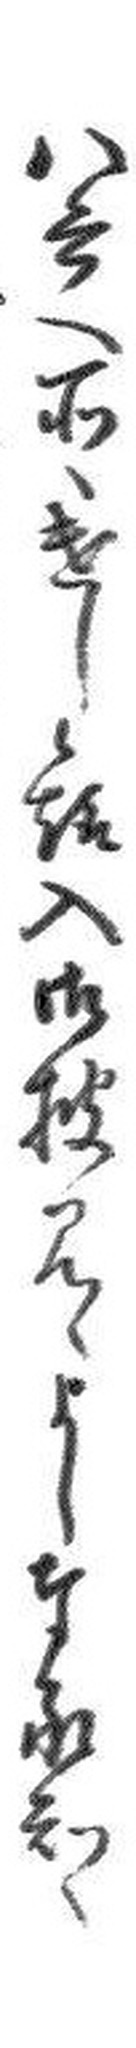八兵へ所ヘ遣し候趣入御披見候よし奉承知候
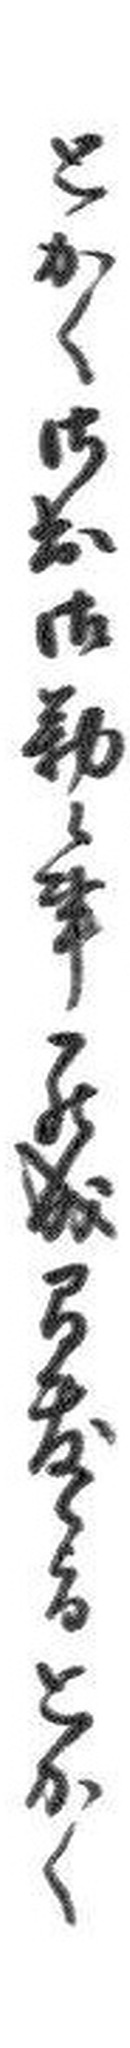とかく御出御勤候事罷成間敷候旨とかく
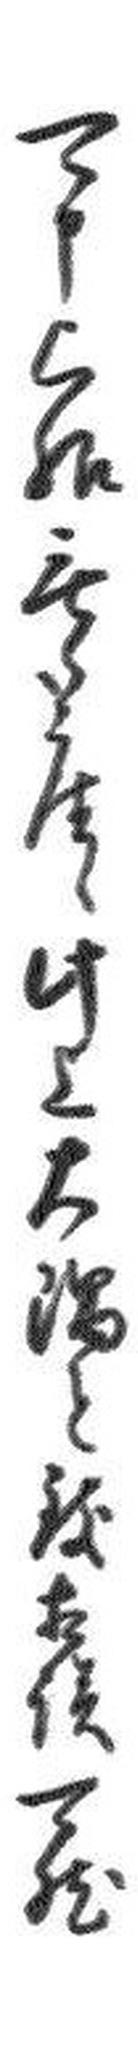可申上様無御座候此上大隅と致相談可然

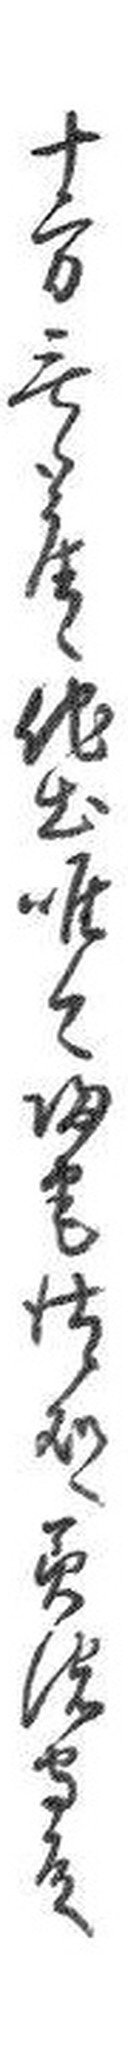十方無御座候他出唯今帰宅仕候処ヘ美濃守殿
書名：家譜 十一 昌親公 従延宝二年到延宝四年八月
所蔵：福井県文書館 Fukui Prefectural Archives
